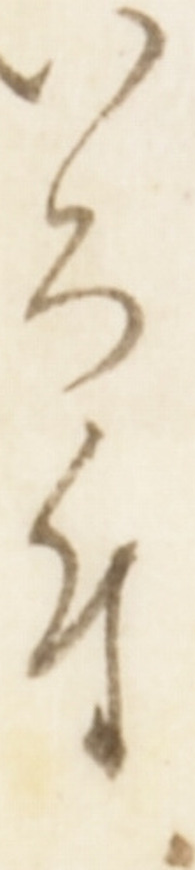いろ付
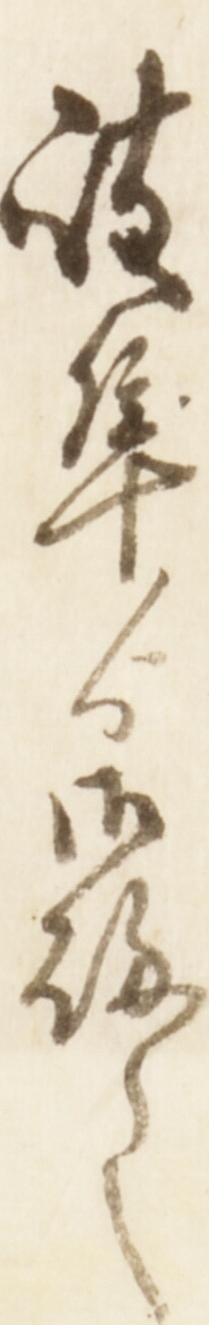岐阜ゟ御帰り之
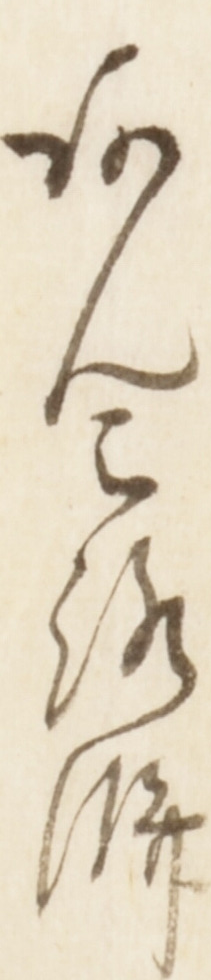あんころ餅
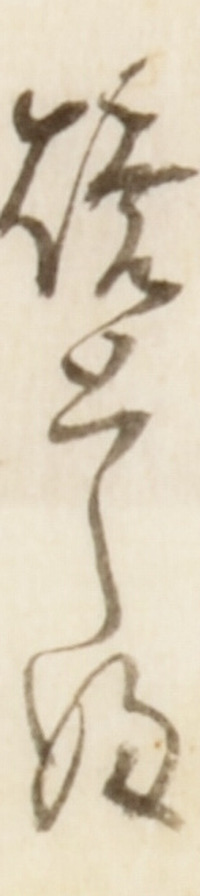焼とうふ
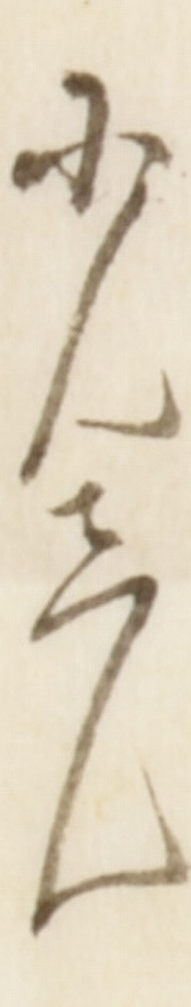にんしん
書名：（諸事控）
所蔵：伊那市立高遠町図書館・合同会社AMANE
